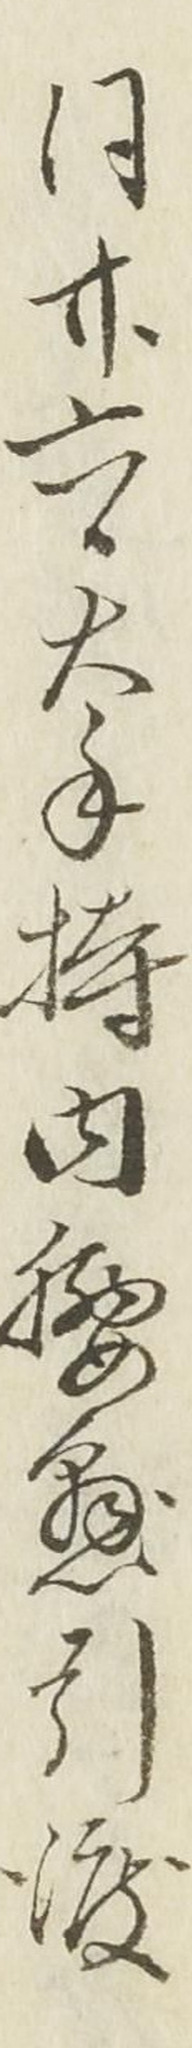同廿六日大手持内腰懸引渡
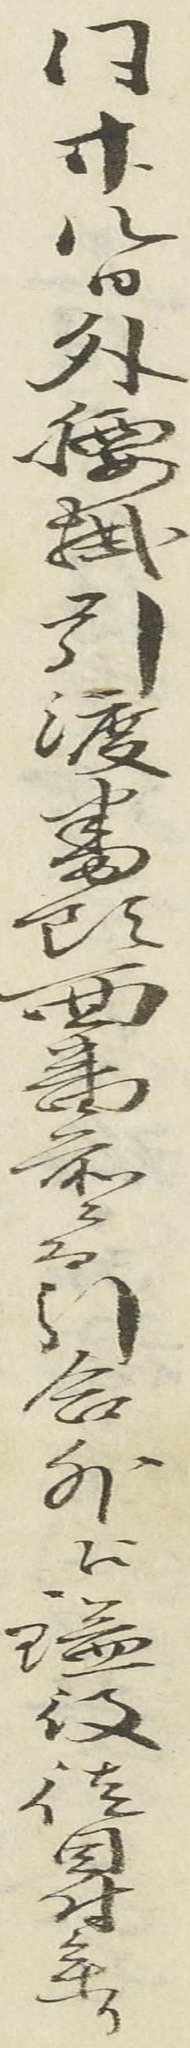同廿八日外腰掛引渡番頭西番前ニ而引合外え鎰役徒目付参り
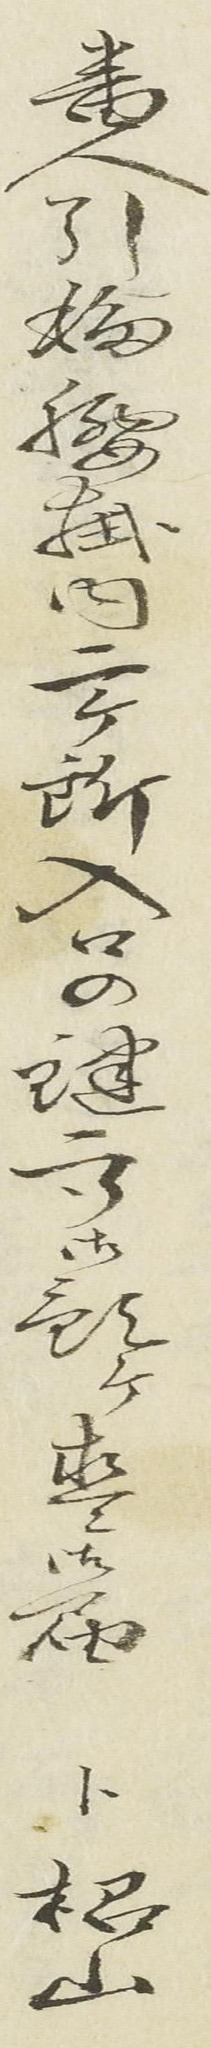番人引移腰掛内二ヶ所入口の鍵二ッ御預ケ直ニ御届ト椙山
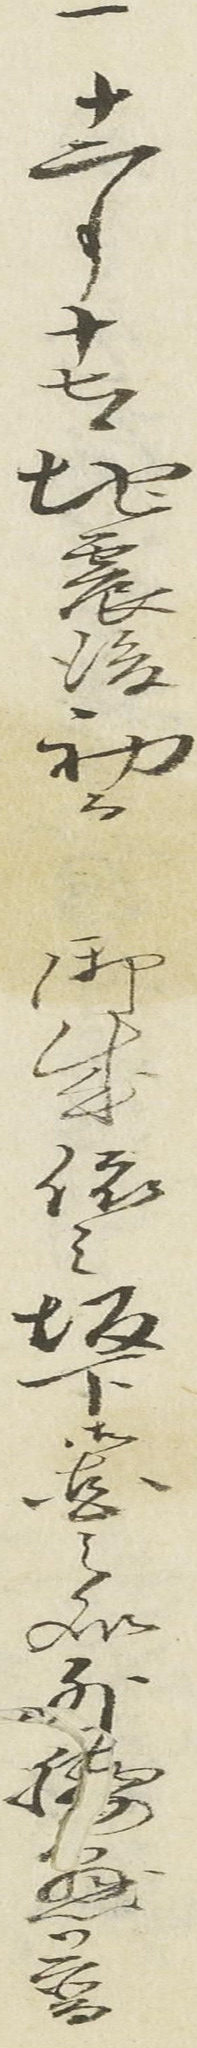一十二月十七日地震後初而御成依之坂下御固之処外腰懸の普
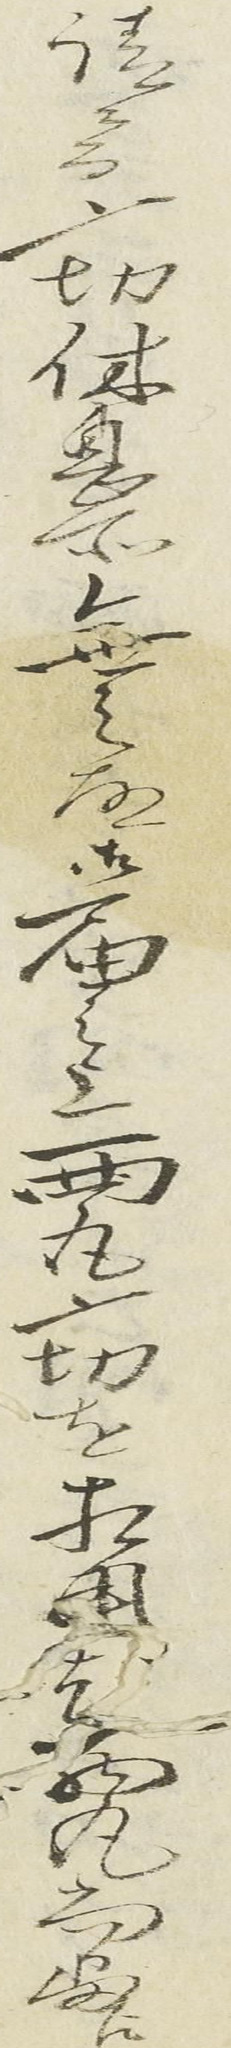請ニ而〆切休息所無之故御届之上西丸〆切を相用尤西丸尚歩え
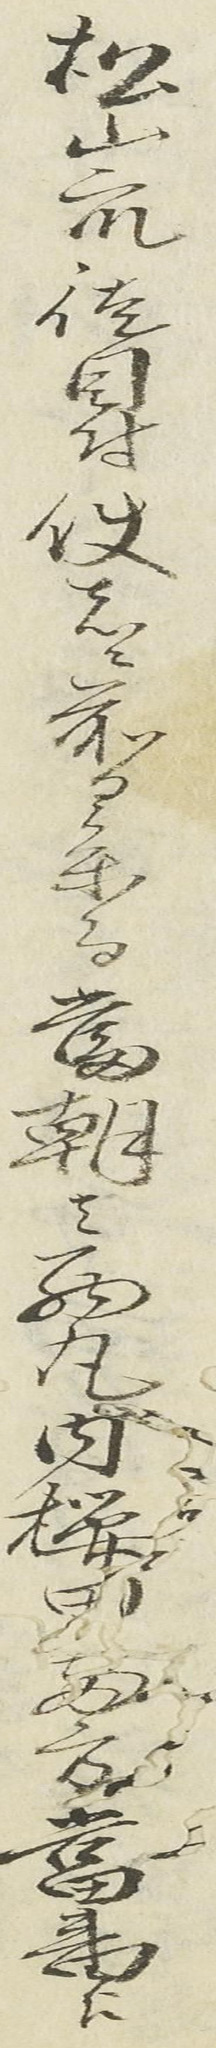松山衆徒目付使者ニ前日参る当朝は西丸内桜田両方当番え

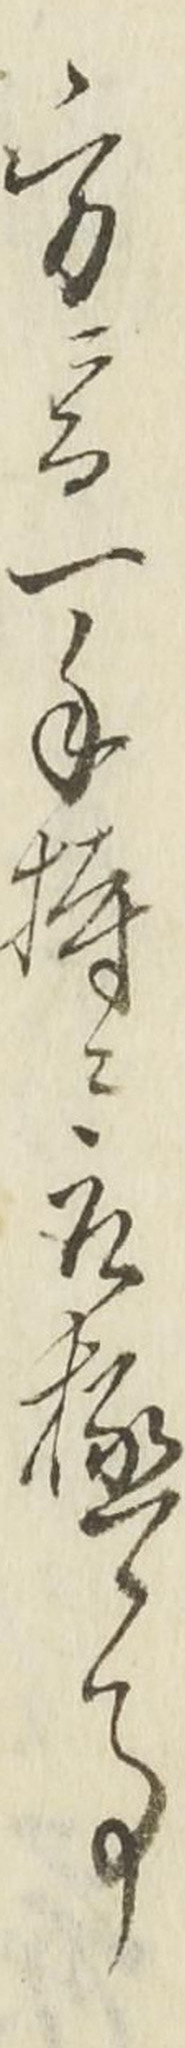方ニ而一手持ニ取極候事
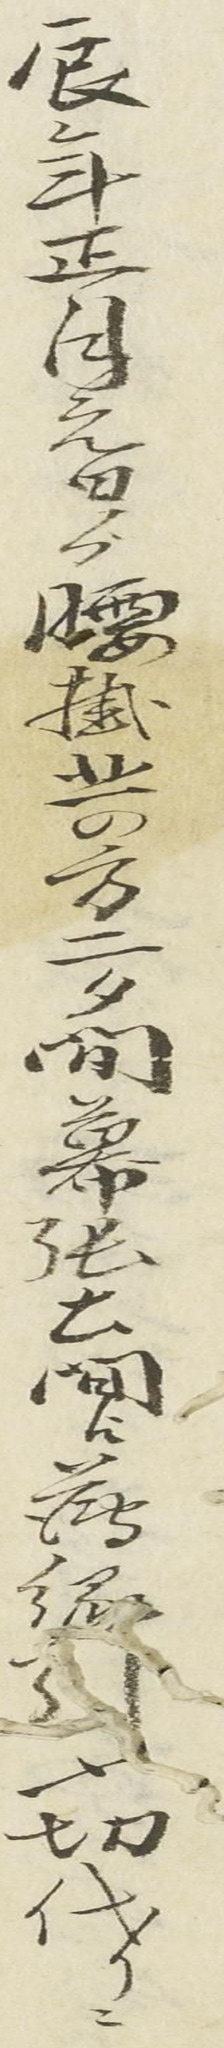辰年正月元旦ゟ腰掛北の方二タ間幕張土間え薄縁引〆切代りニ
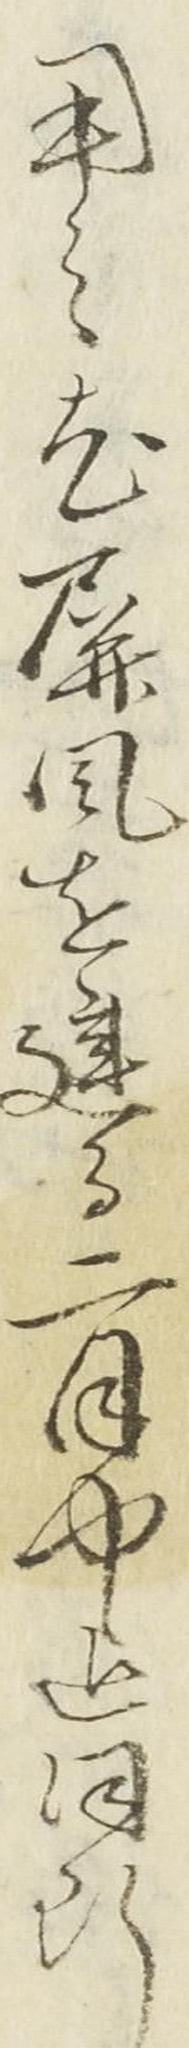用之尤屏風を建る二月中迄同断
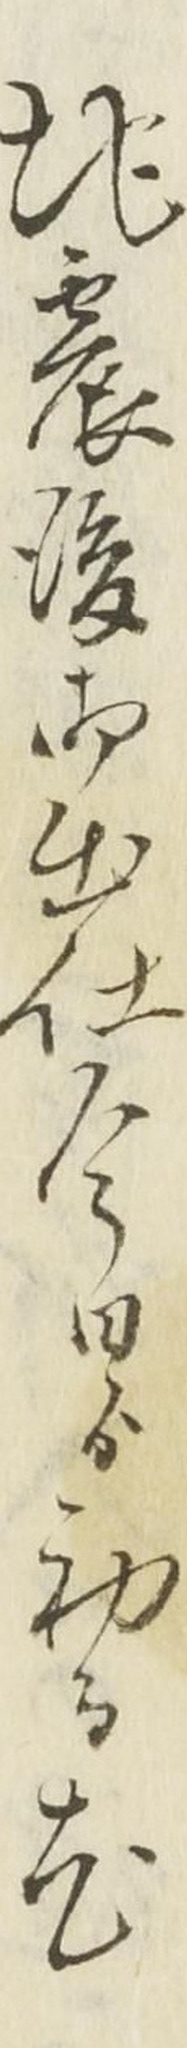地震後御出仕今日ゟ初而尤
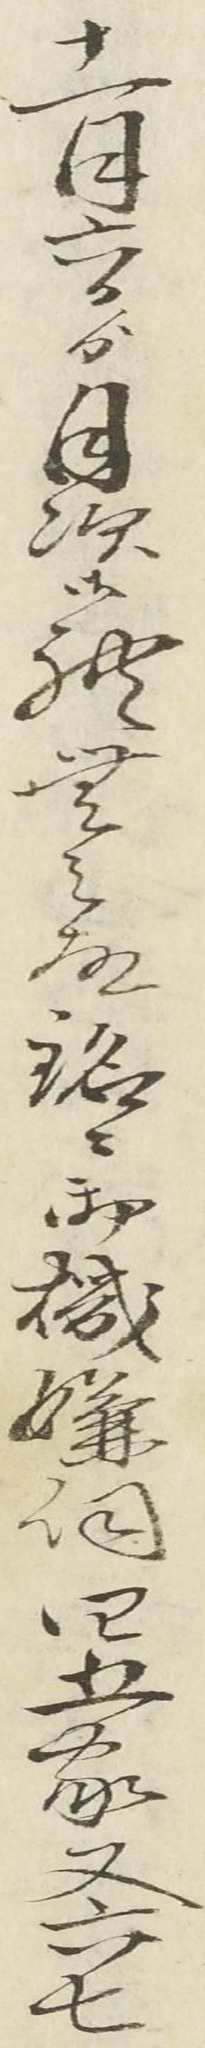十一月六日ゟ月次御禮無之故銘々御機嫌伺四五家又六七
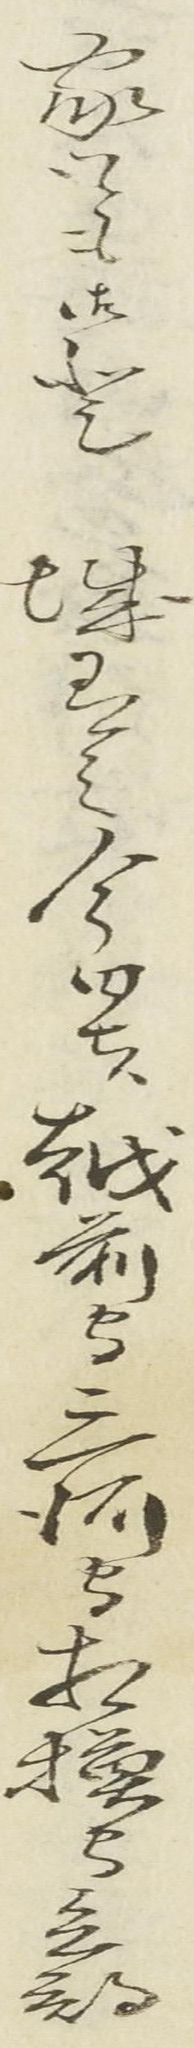家ツゝも御登城有之今日は越前守三河守相模守兵部
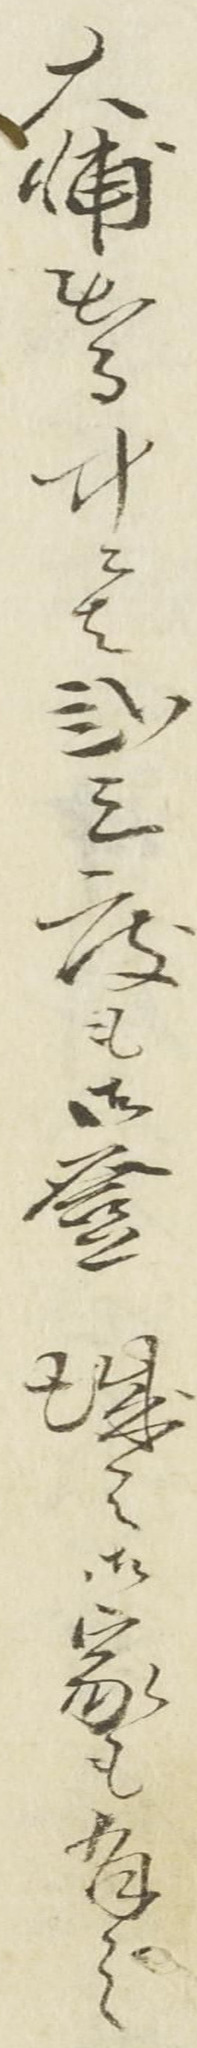大輔出る中ニは弐三度も御登城之御家も有之
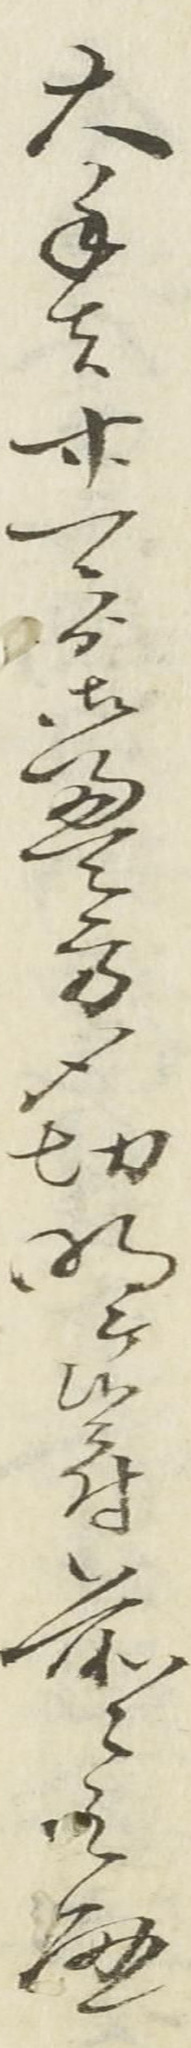大手は廿一日ゟ御畳方〆切明ケ候ニ付前々之通
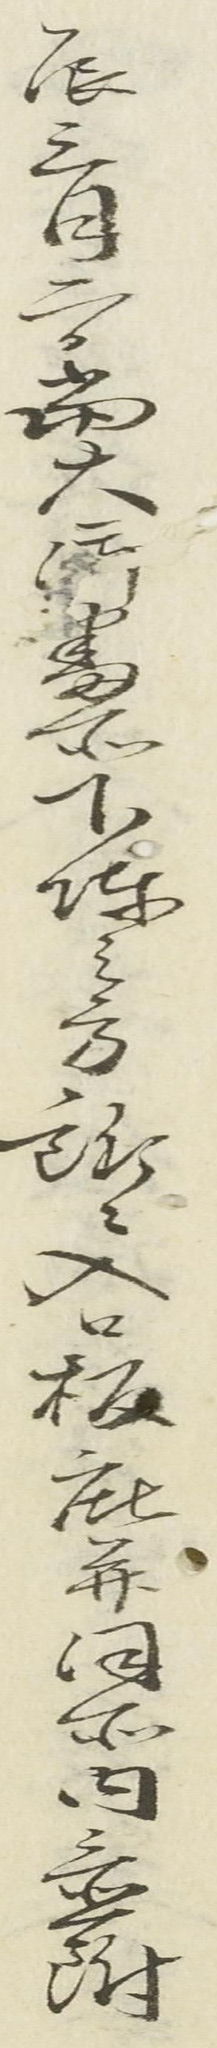辰三月二日当大御番所下陣之方所々入口板庇幷同所内置附
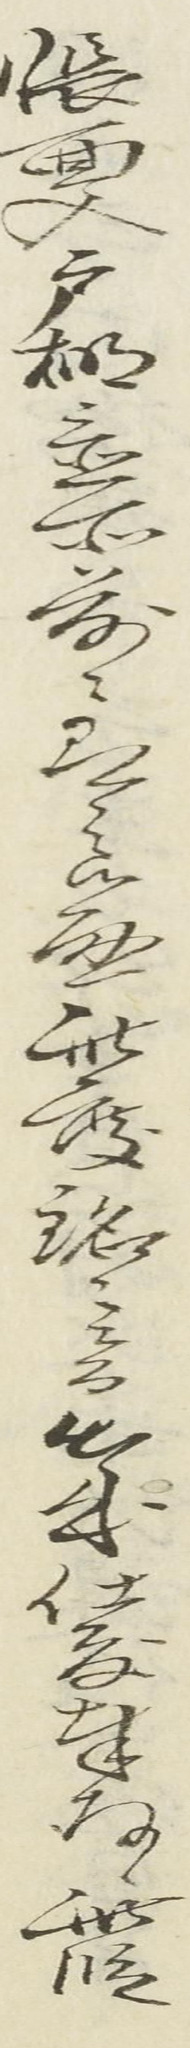帳面入戸棚置所前々有之候通此度銘々ニ而出来仕度奉存候此段
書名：安政二乙卯年十月二日大地震之事
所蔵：東京大学地震研究所図書室 Earthquake Research Institute Library, The University of Tokyo, JAPAN
